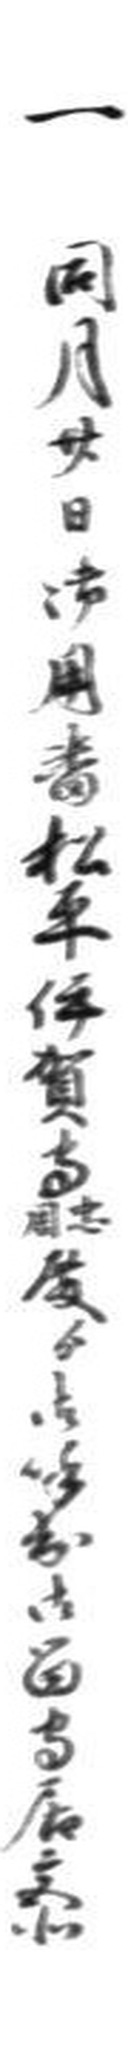一同月廿日御用番松平伊賀守忠周殿ゟ御呼出御留守居宮北
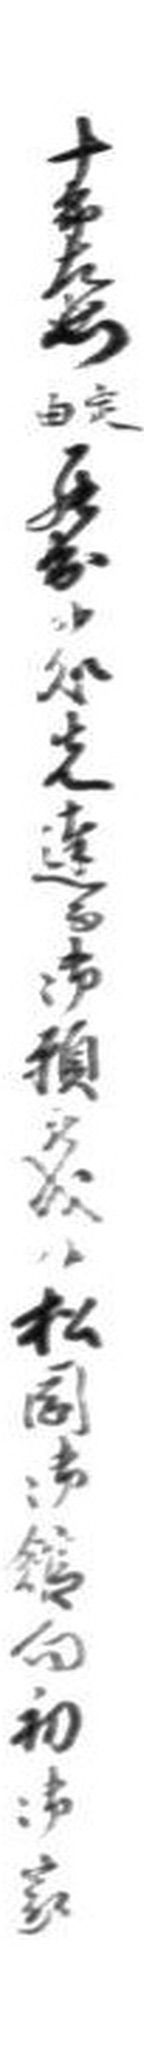十郎左衛門定由罷出候処先達而御願被成候松岡御館向初御家
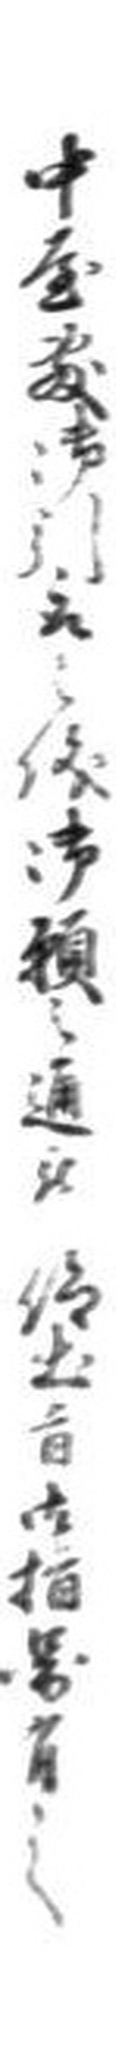中屋敷御引取之儀御願之通被仰出旨御指図有之

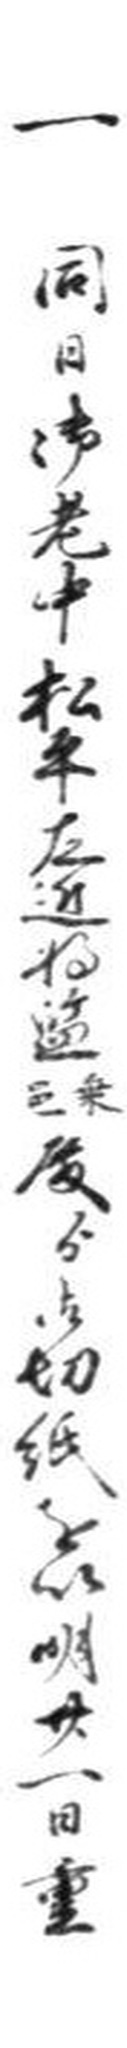一同日御老中松平左近将監乗邑殿ゟ御切紙を以明廿一日重
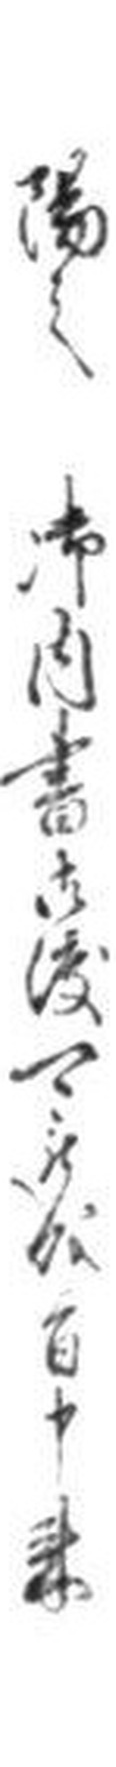陽之御内書御渡可被成旨申来
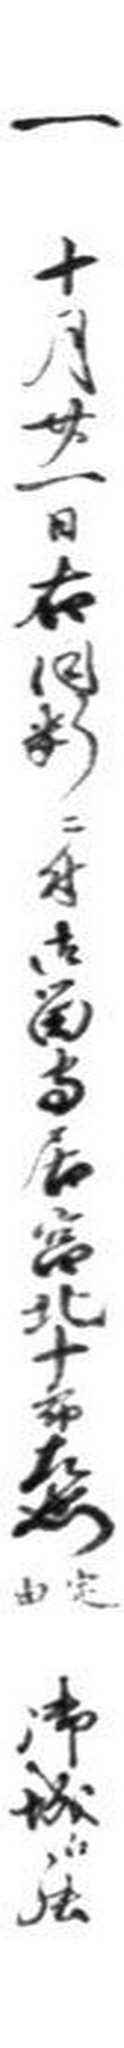一十月廿一日右同断ニ付御留守居宮北十郎左衛門定由御城江罷
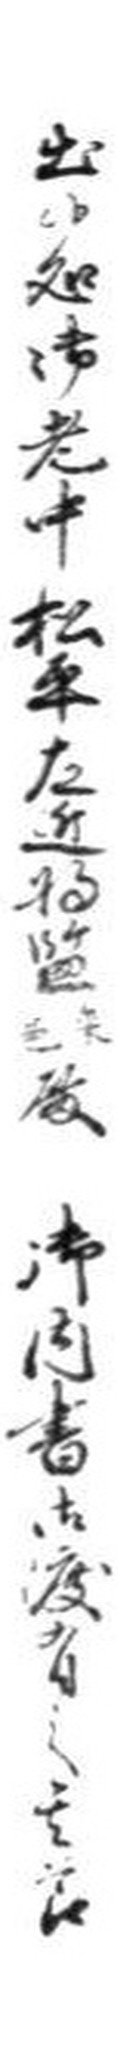出候処御老中松平左近将監乗邑殿御内書御渡有之其節
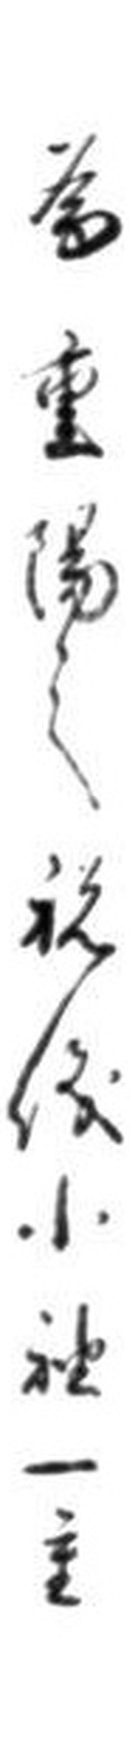為重陽之祝儀小袖一重
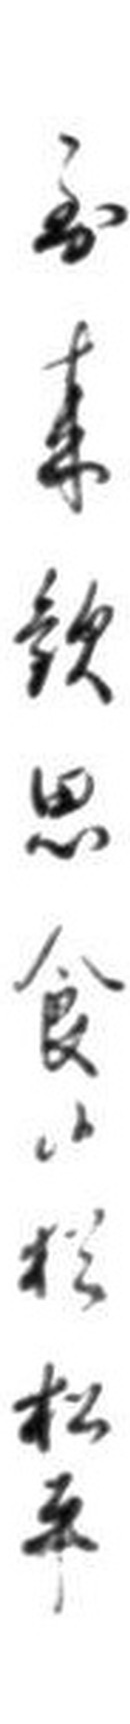到来歓思食候猶松平
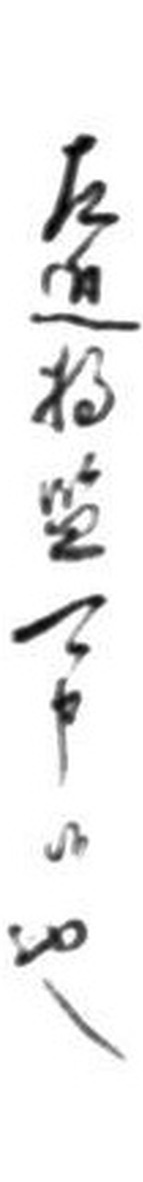左近将監可申候也
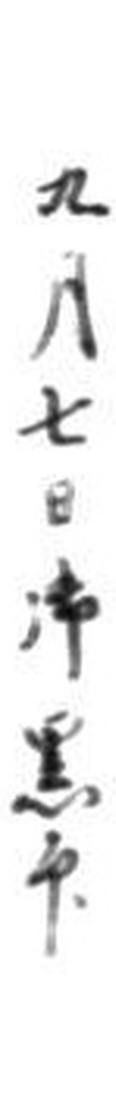九月七日御黒印
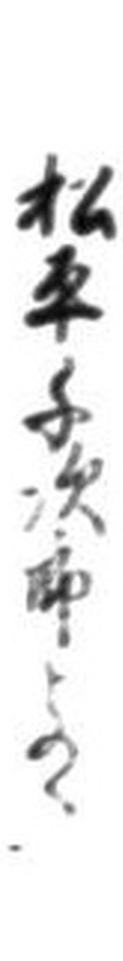松平千次郎とのへ
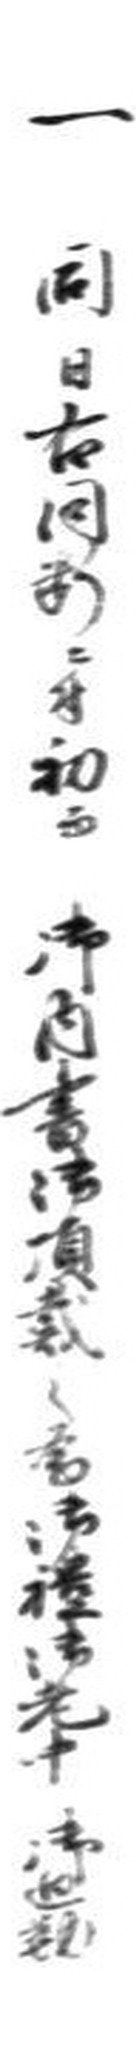一同日右同断ニ付初而御内書御頂戴之為御礼御老中御廻勤
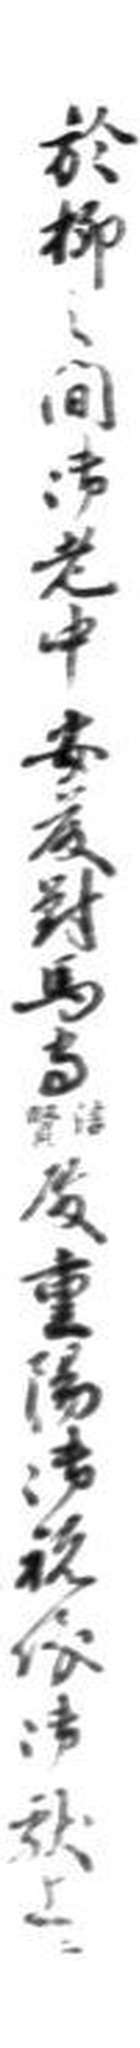於聊之間御老中安藤対馬守信賢殿重陽御祝儀御献上ニ
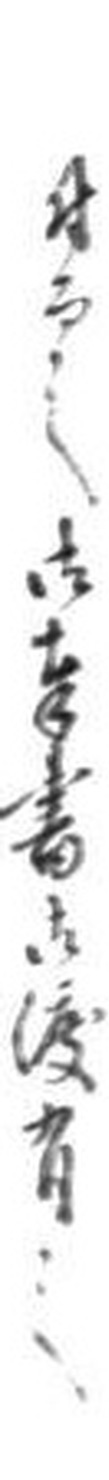付而之御奉書御渡有之
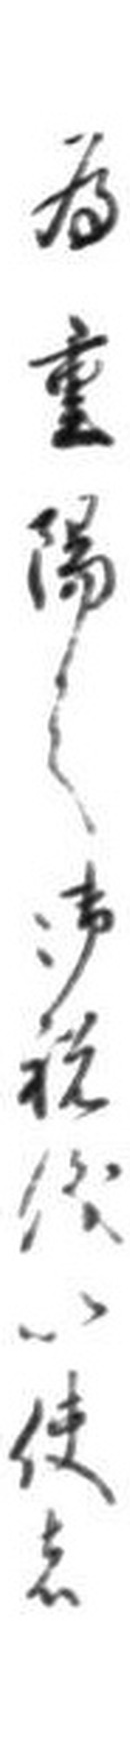為重陽之御祝儀以使者
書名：家譜 三十九 宗矩公 享保十年
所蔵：福井県文書館 Fukui Prefectural Archives
